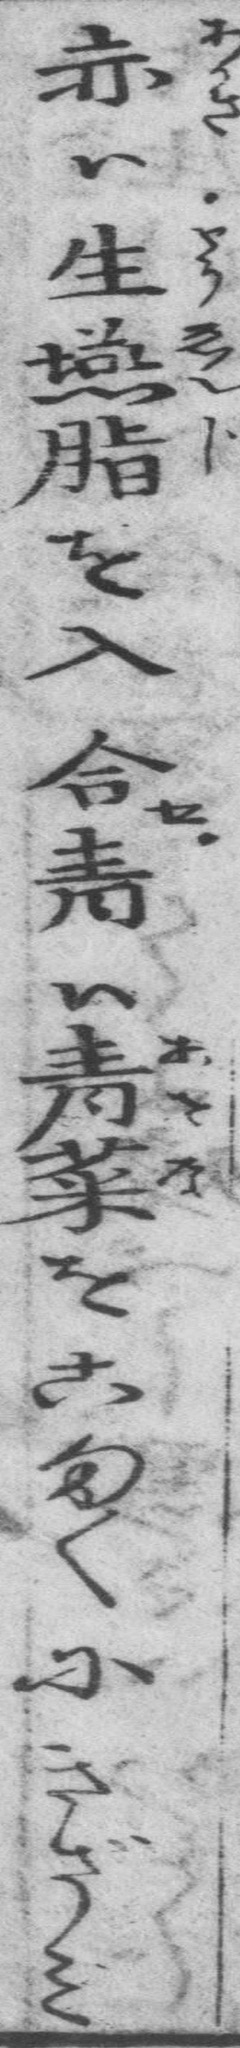赤は。生臙脂を入合せ。青は青菜をこま〳〵にきざみ

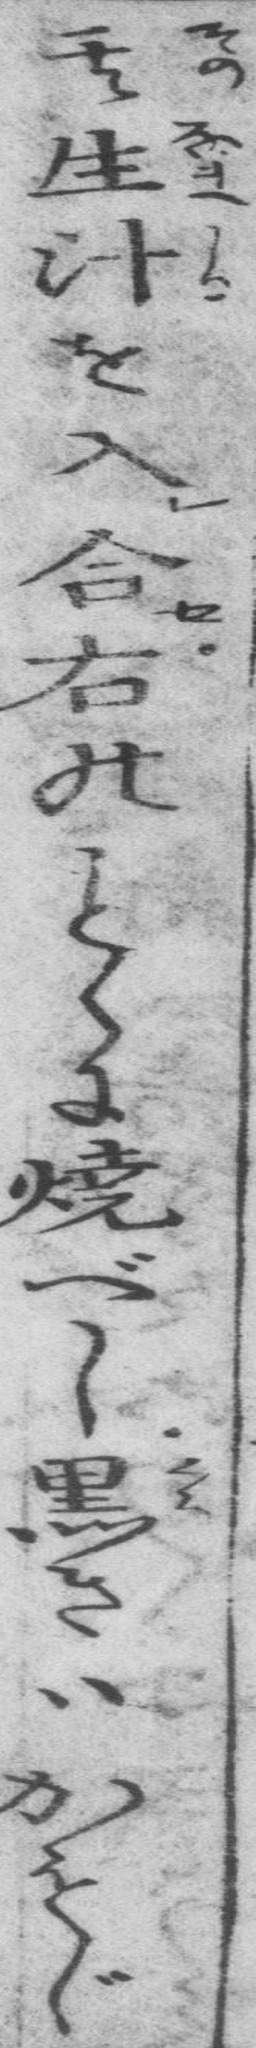其生汁を入れ合せ。右のことくに焼べし。黒きはかもじ
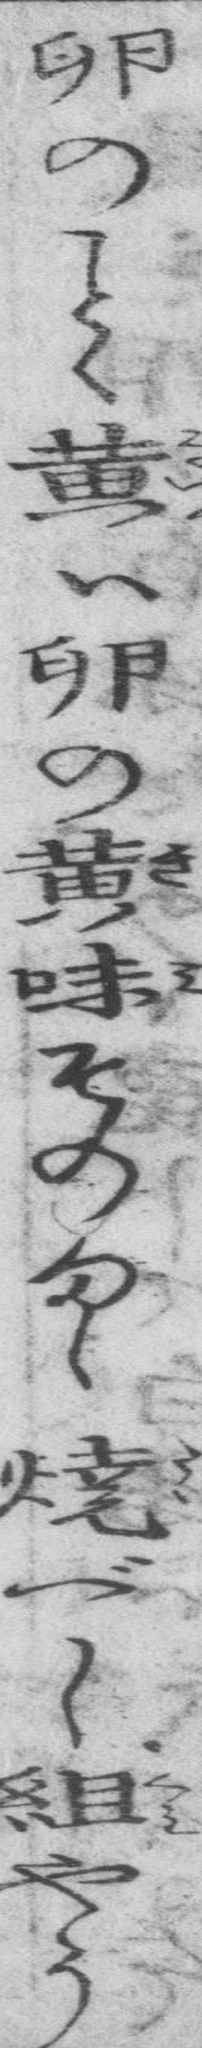卵のことく黄は卵の黄味そのまゝ焼べし。組やう
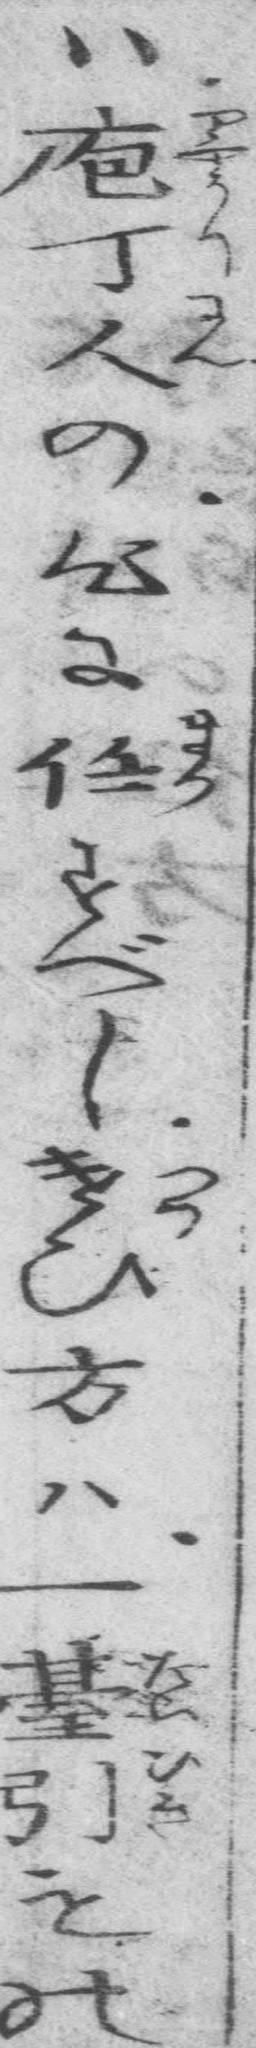は。包丁人の。心に任すべし。遣ひ方は。一台引もの
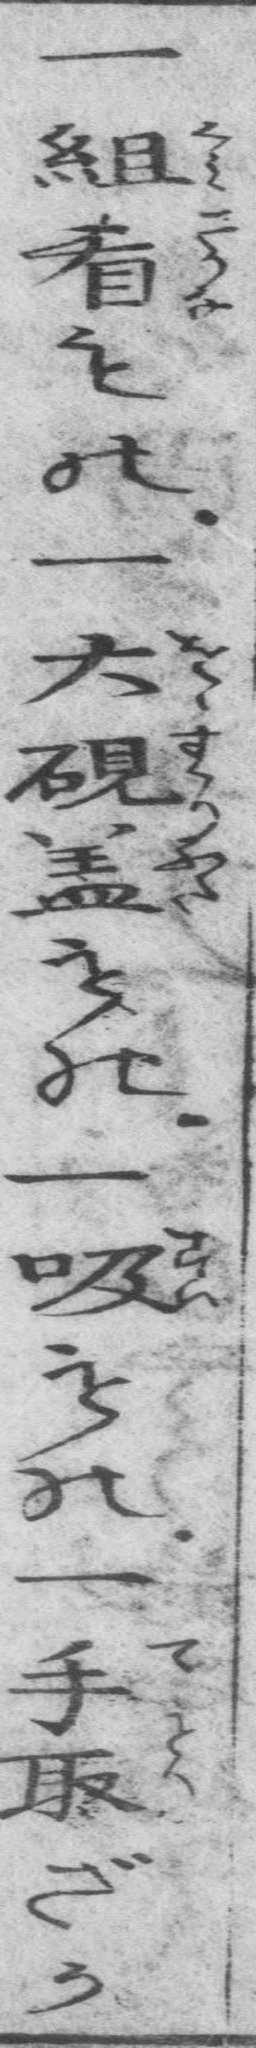一組肴もの。一大硯蓋もの。一吸もの。一手取ざか
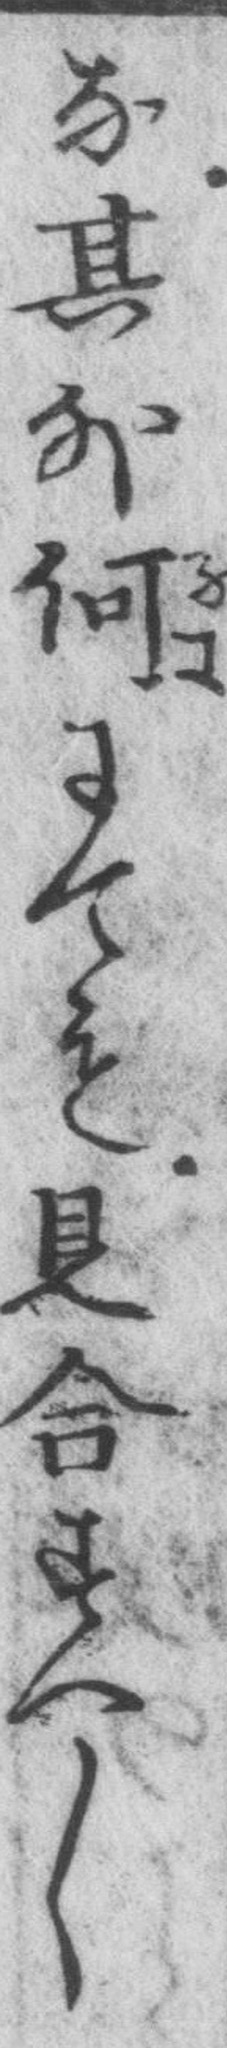な。其外何にても。見合すへし
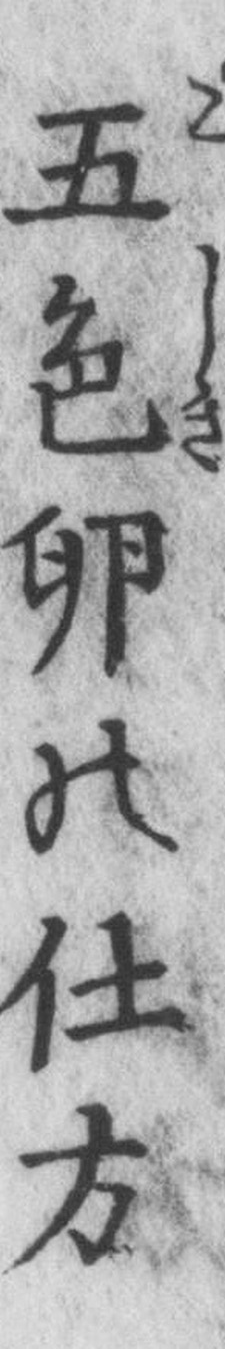五色卵の仕方
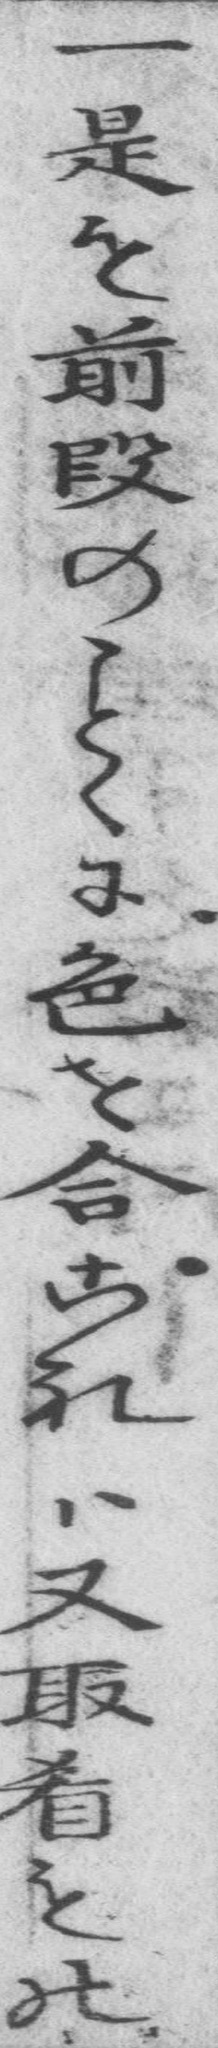一是も前段のことくに。色を合。これは又取肴もの。
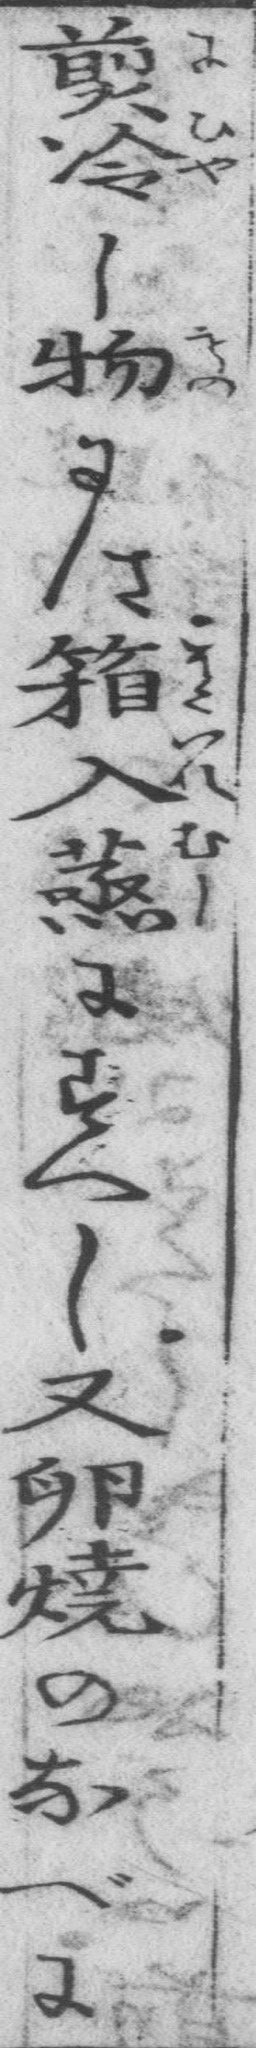煎冷し物には。箱入蒸にすへし。又卵焼のなべに
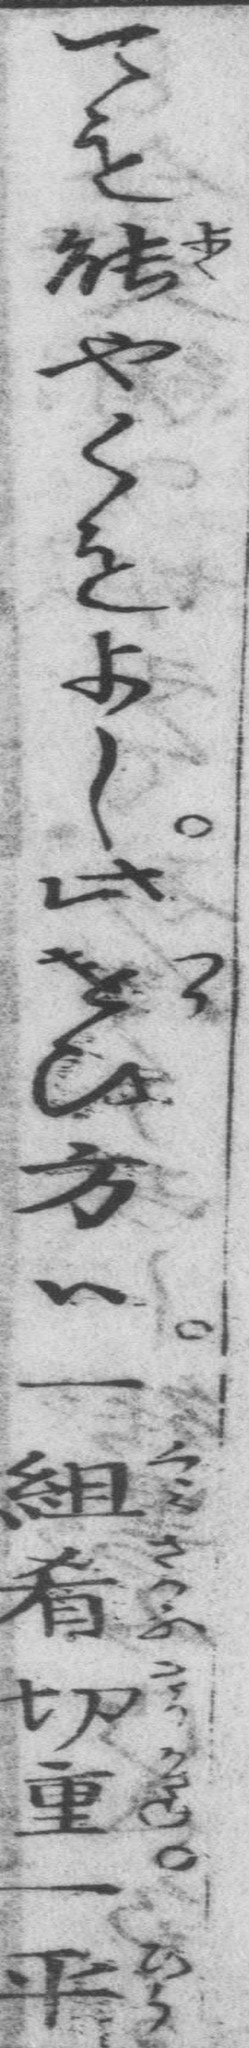ても能やくもよし。此遣ひ方は。一組肴切重。一平
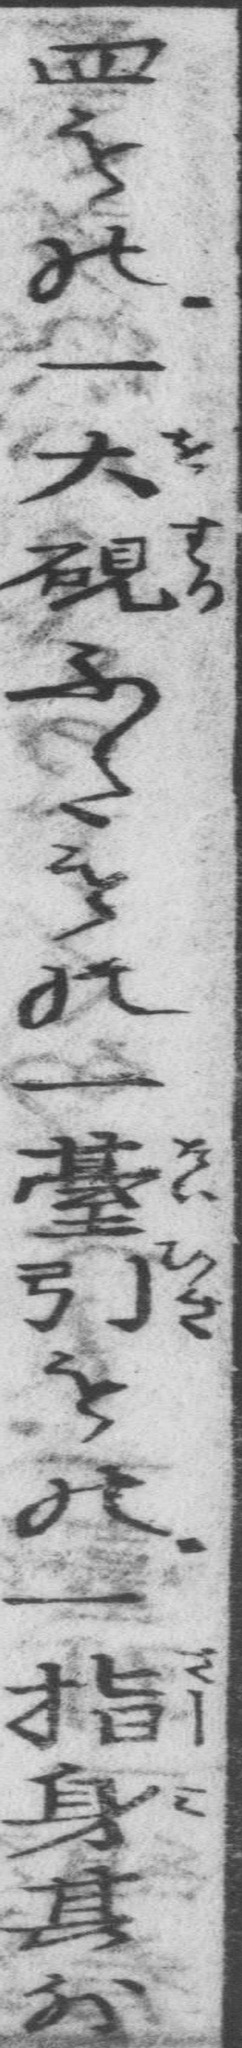皿もの。一大硯ふたもの一台引もの。一指身其外
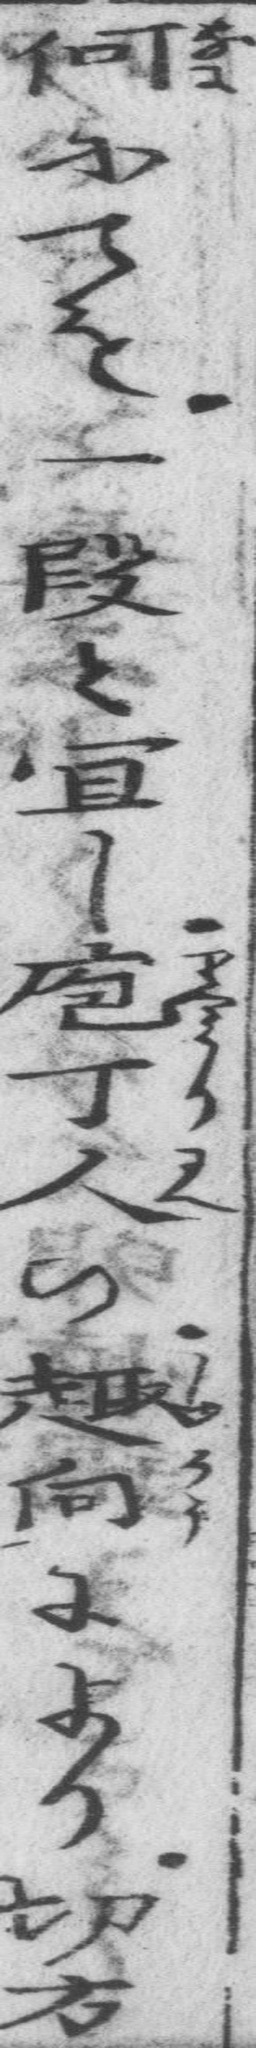何にても。一段と宜し。包丁人の。趣向により。切方
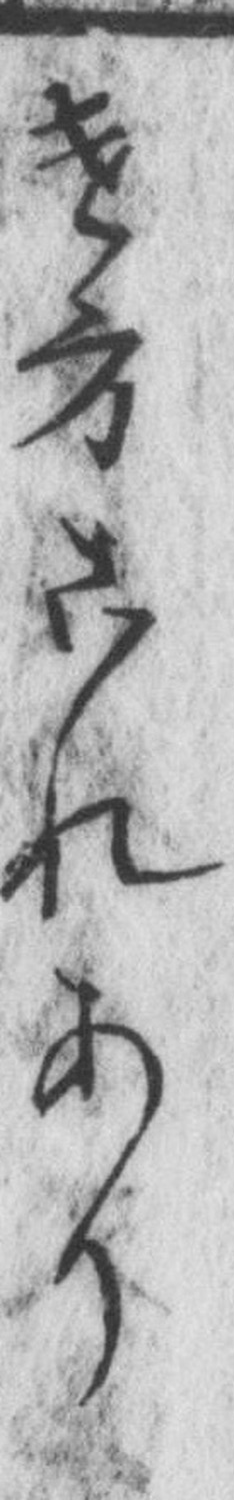遣方これあり
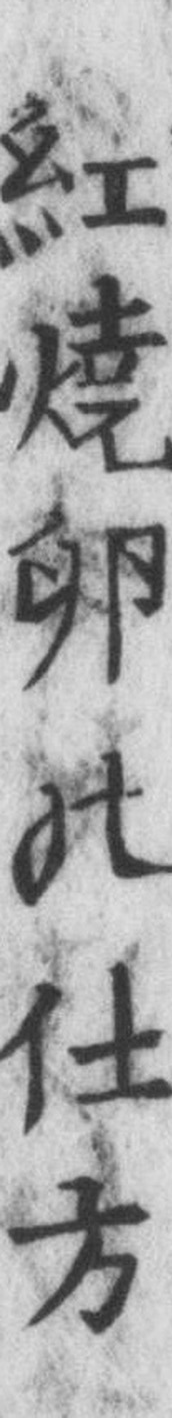紅焼卵の仕方
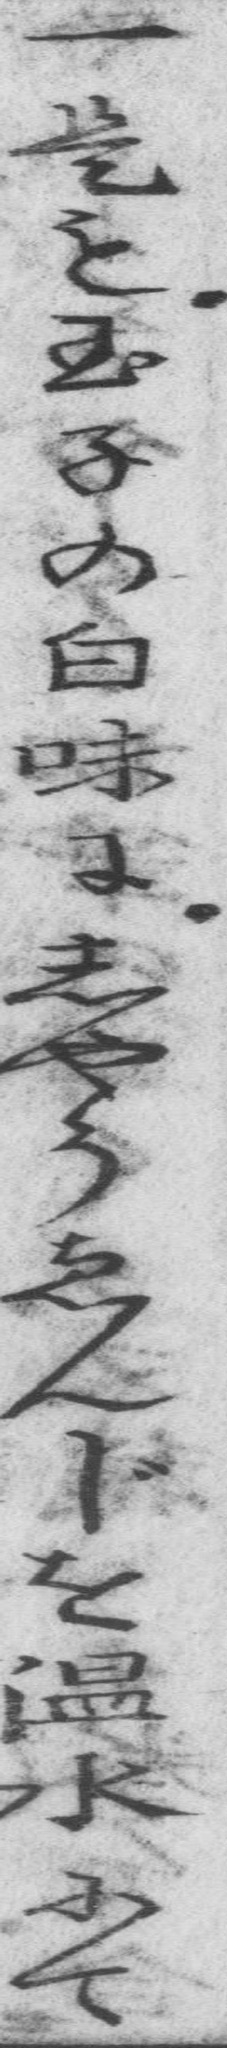一是も。玉子の白味に。しやうゑんじを温水にて
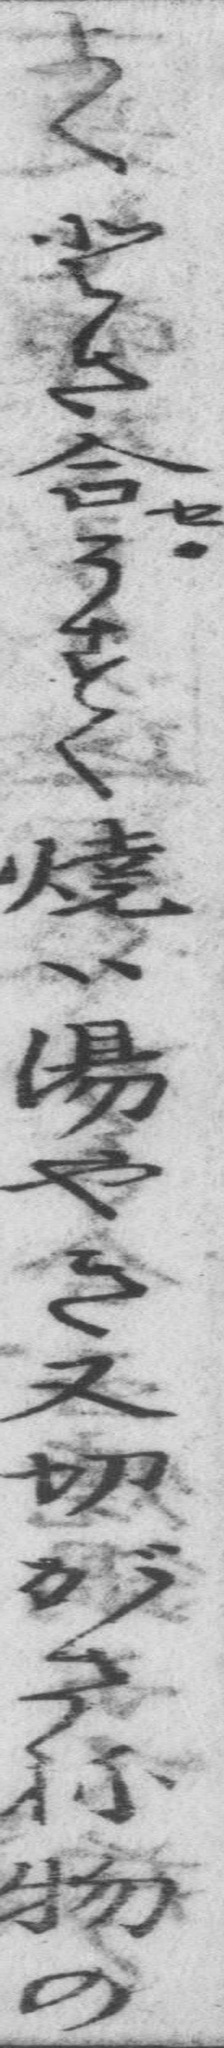よくとき合せ。うすく焼は湯やき又切がさね物の
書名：萬寳料理秘密箱
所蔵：大阪府立大学学術情報センター 国文学研究資料館
